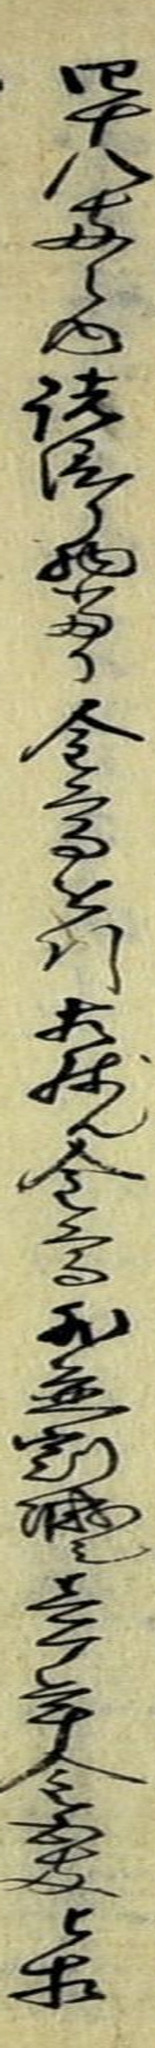四十八両之内諸渡り物当り金高を引相残ル金高外並割減シ壱ケ年金高五両被相
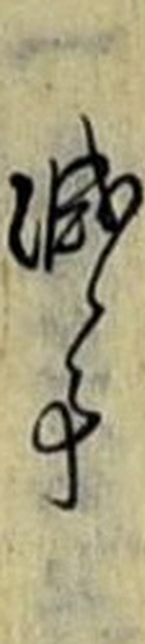減候事
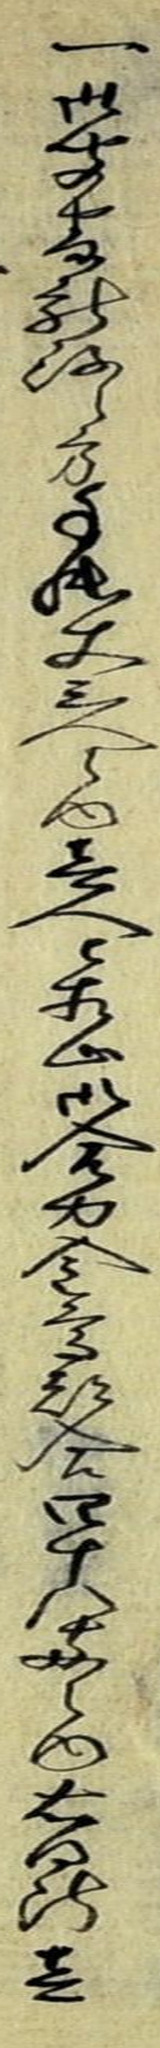一御聞番新役之方手紙使三人之内壱人被相止御合力金高都合四十八両之内右同断壱
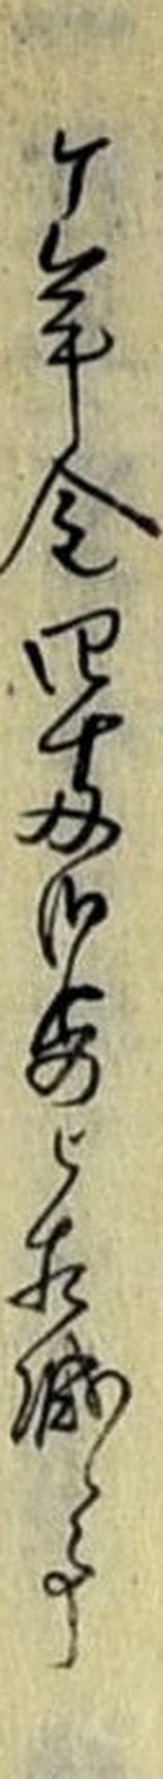ケ年金四両弐歩被相減候事
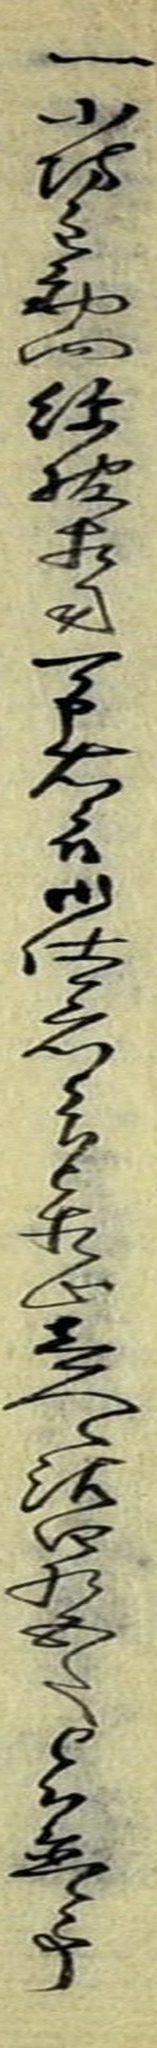一小坊主勤向綿服相用可申右ニ付御仕着被下被相止壱人へ銀四拾五匁被下置候事
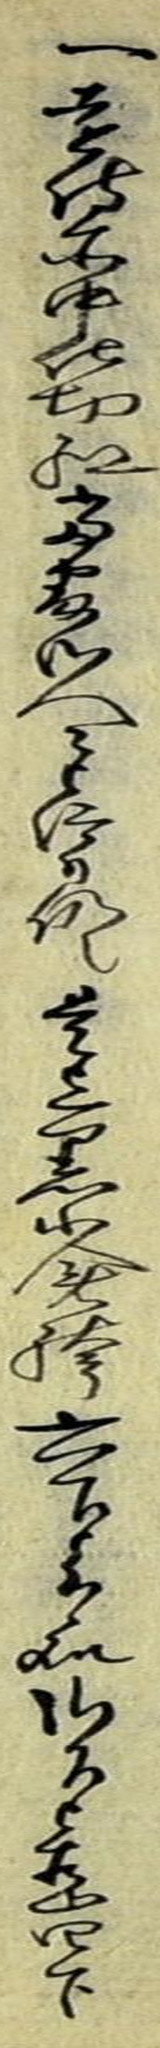一遠侍所中仕切組当番弐人ニ被仰付仍之是迄黒小倉袴六下被下候処弐下被相止四下
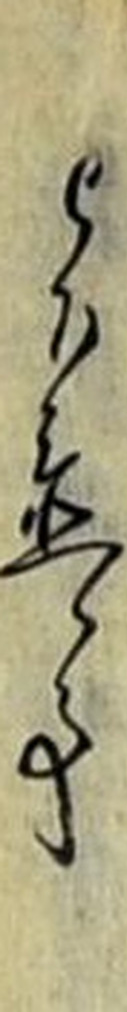被下置候事
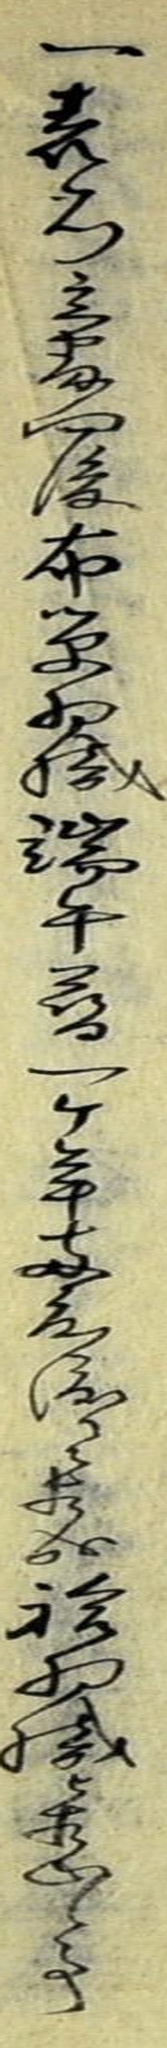一表御門立番向後布単羽織端午暮一ケ年両度渡りニ相成袷羽織被相止候事
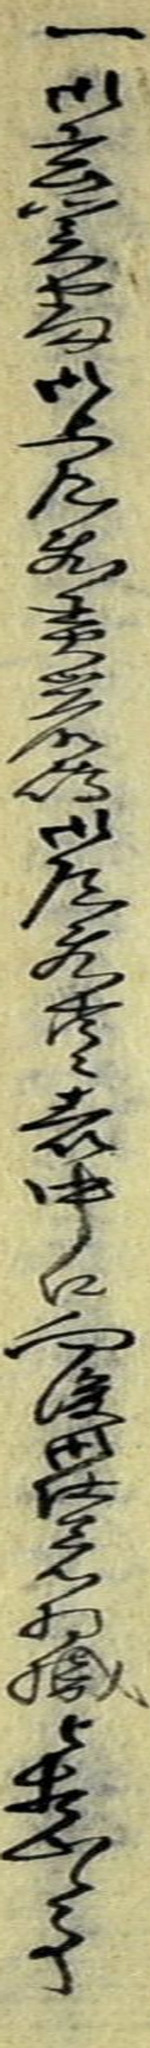一御玄関番御上屋敷霊厳嶋御屋敷共ニ表中ノ口向後御仕着羽織被相止候事
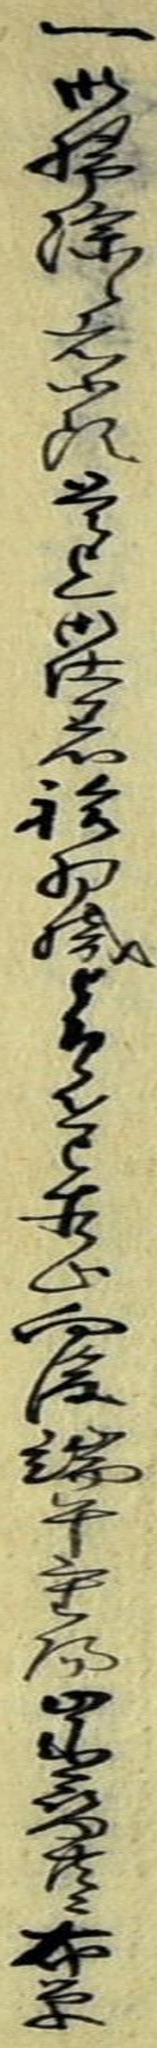一御掃除之者小頭是迄御仕着袷羽織被下候を被相止向後端午重陽歳暮共ニ布単

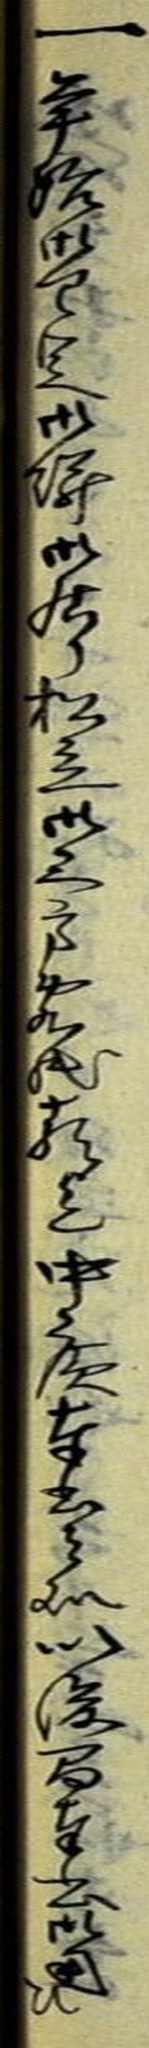一年始御具足御餅御居り松立御三方敷紙類迄中広奉書ニ候処以後間奉書御用ひ
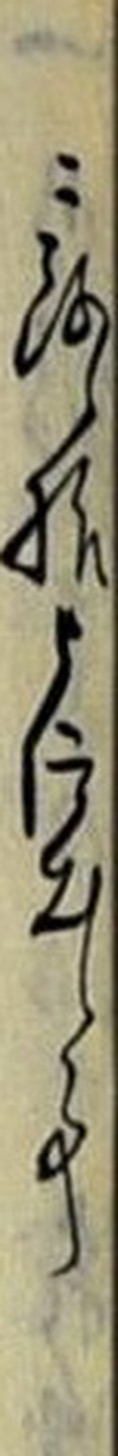ニ致候様被仰出候事

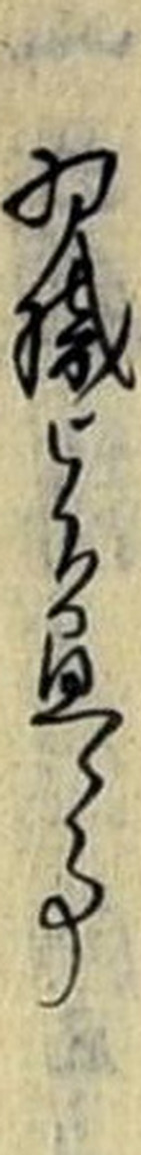羽織被下置候事
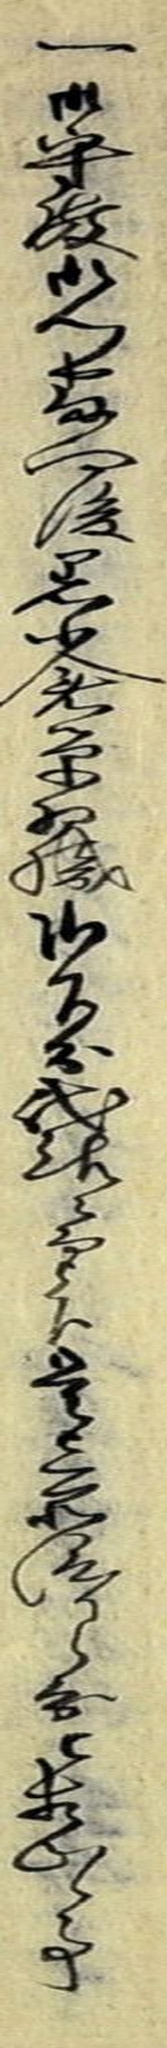一御守殿御門番向後黒小倉単羽織弐下分代銀ニ而被下是迄品渡り之分被相止候事
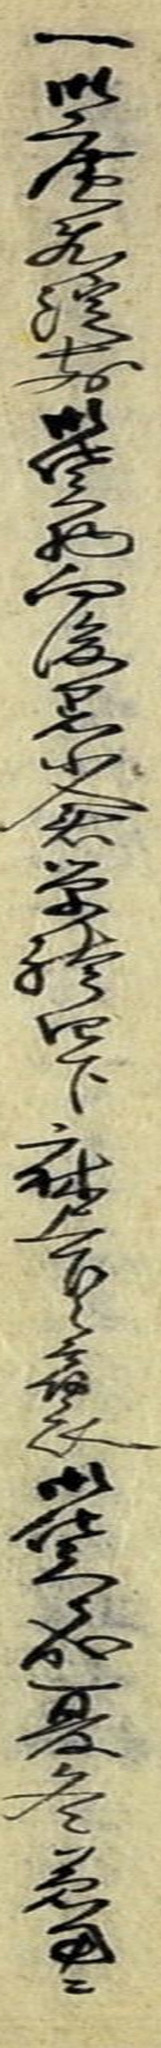一御広敷錠前御貸物向後黒小倉単袴四下麻上下之肩衣御貸被成夏冬兼用ニ
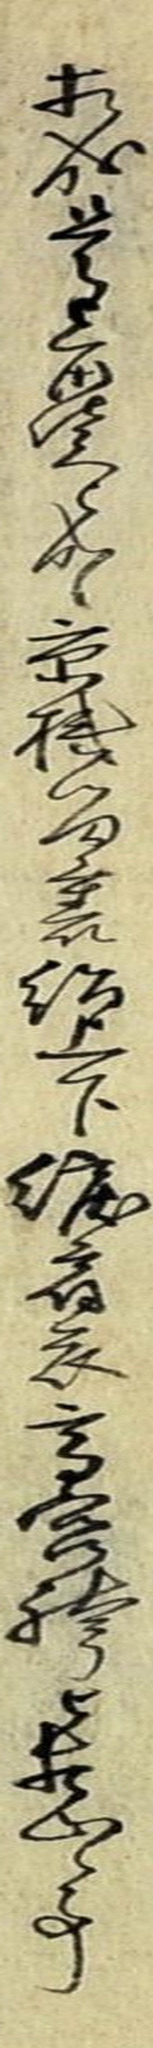相成是迄御貸被成候京機留裏絹上下綟肩衣高宮袴被相止候事
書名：命令之部 三
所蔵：福井県文書館 Fukui Prefectural Archives
